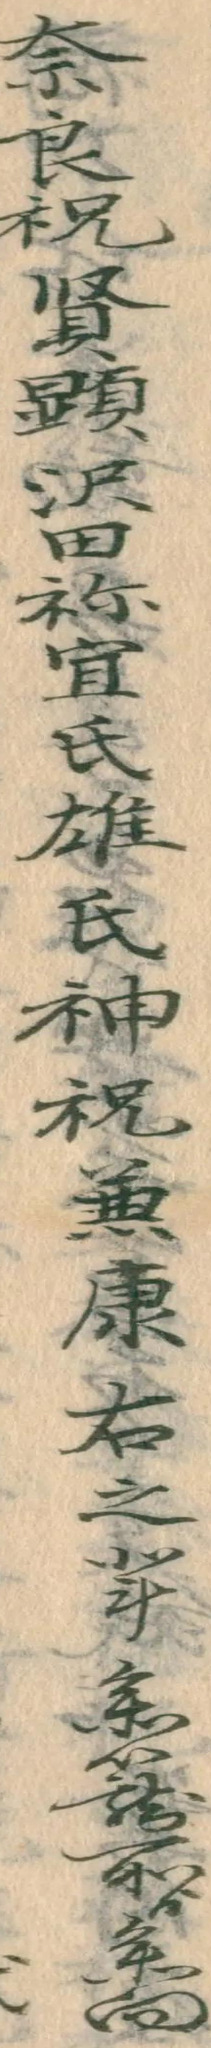奈良祝賢顕沢田祢宜氏雄氏神祝兼康右之輩参籠所ゟ参向
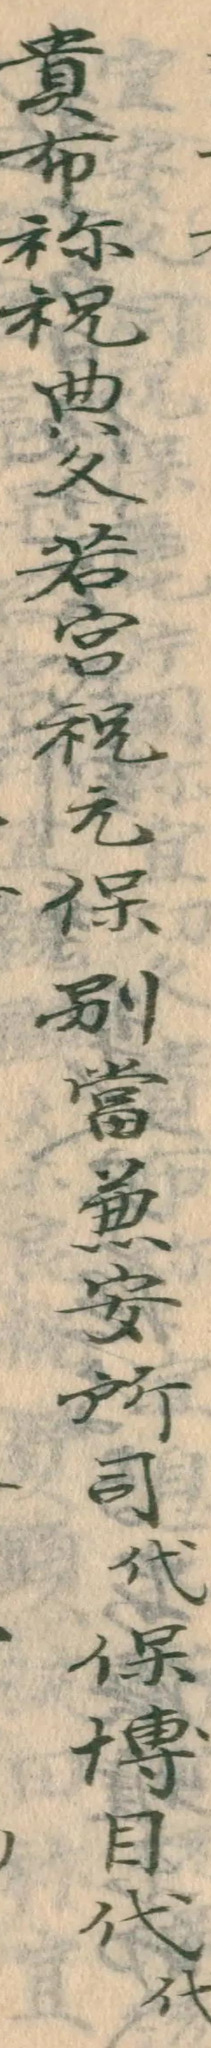貴布祢祝典久若宮祝元保別当兼安所司代保博目代代
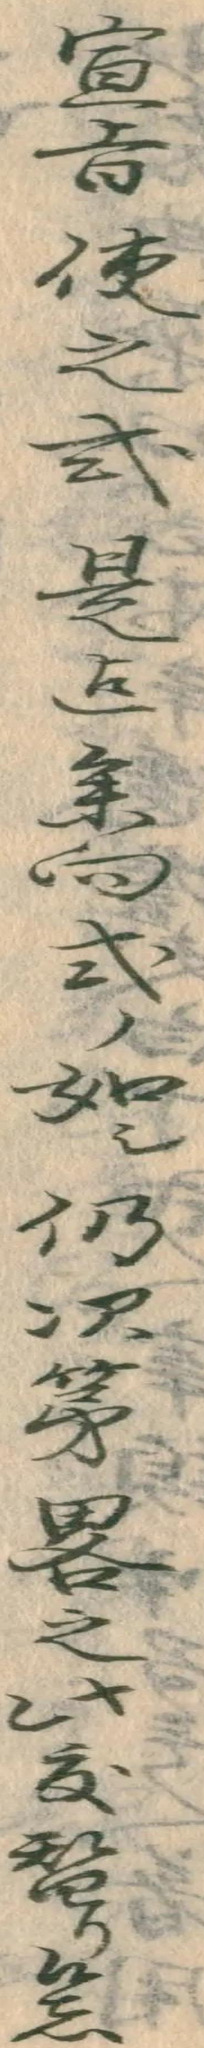一宣旨使之式是迄参向式ノ如シ仍次第略之此度替り候は
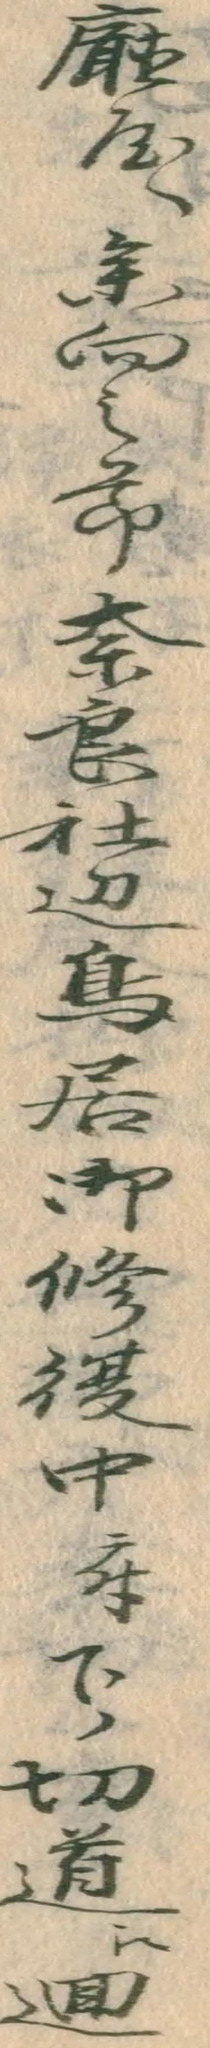庁屋へ参向之節奈良社辺鳥居御修復中ニ付下ノ切道江廻
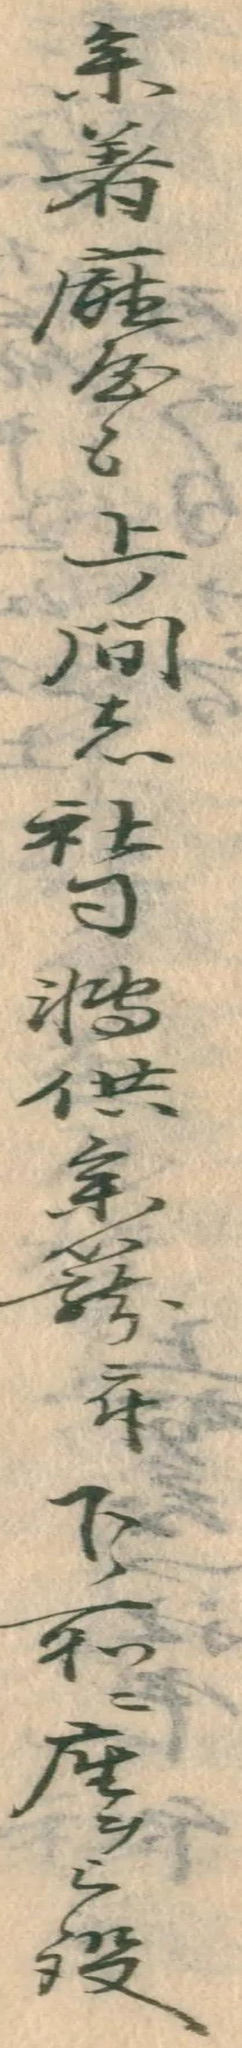参着庁屋も上ノ間は社司転供参籠ニ付下ノ所ニ座ヲ被設
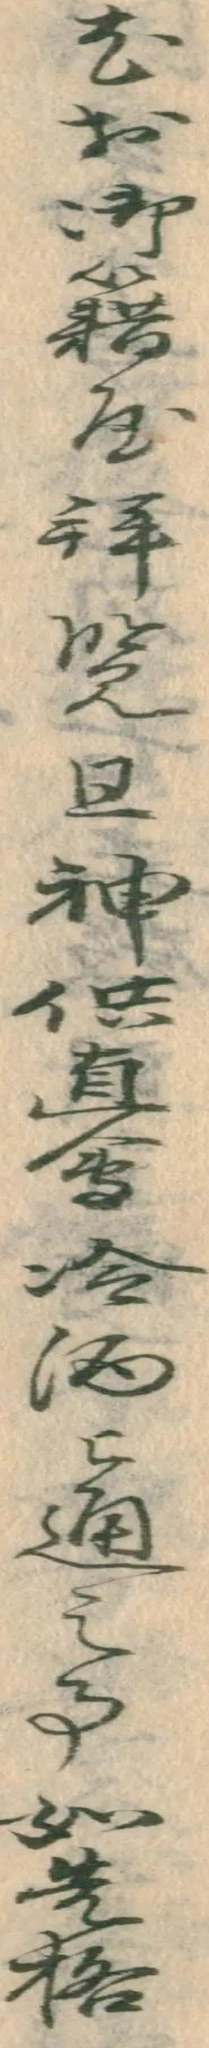尤於御籍屋拝覧且神供直会冷酒被通之事如先格
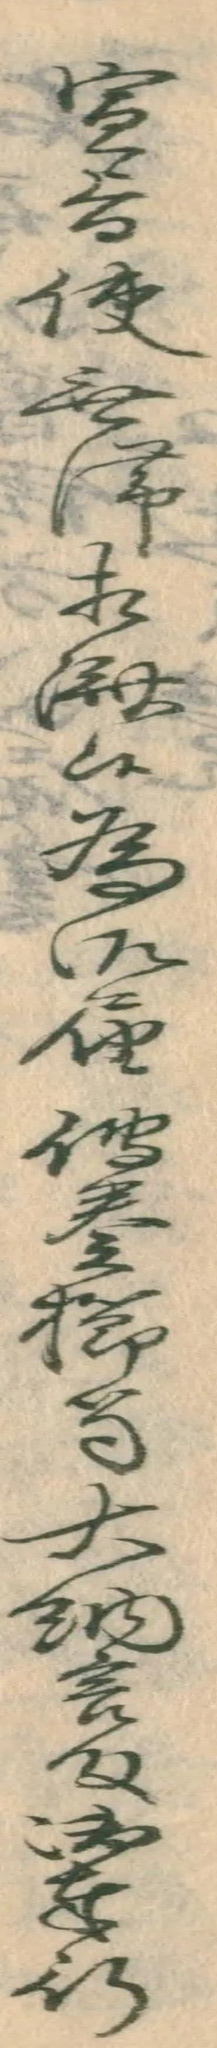一宣旨使無滞相済候為御届伝奏櫛笥大納言殿御奉行
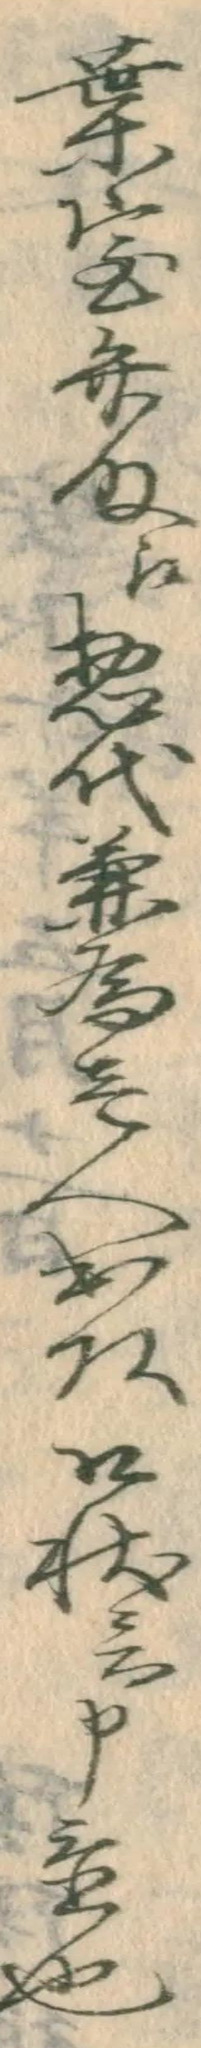葉室弁殿江惣代兼為壱人出頭口状二而申置也
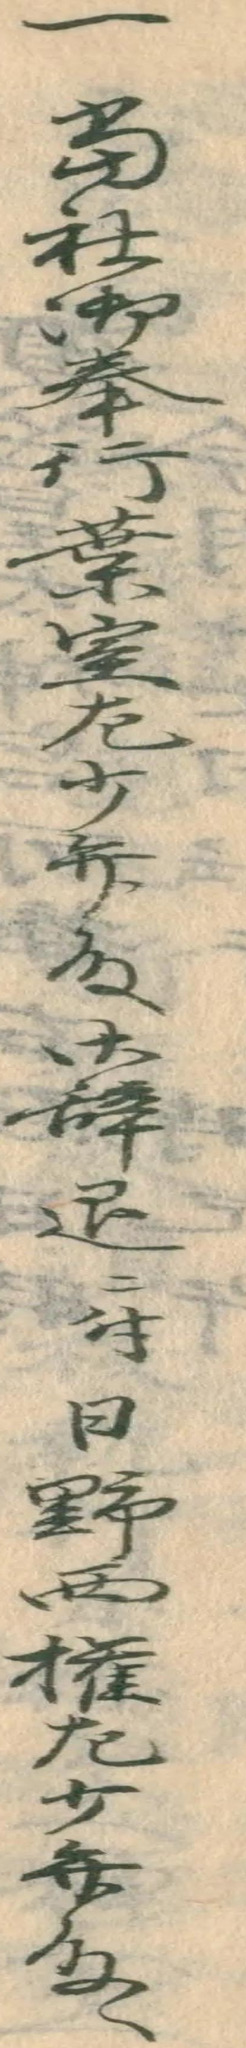一当社御奉行業室左少弁殿御辞退ニ付日野西権左少弁殿へ
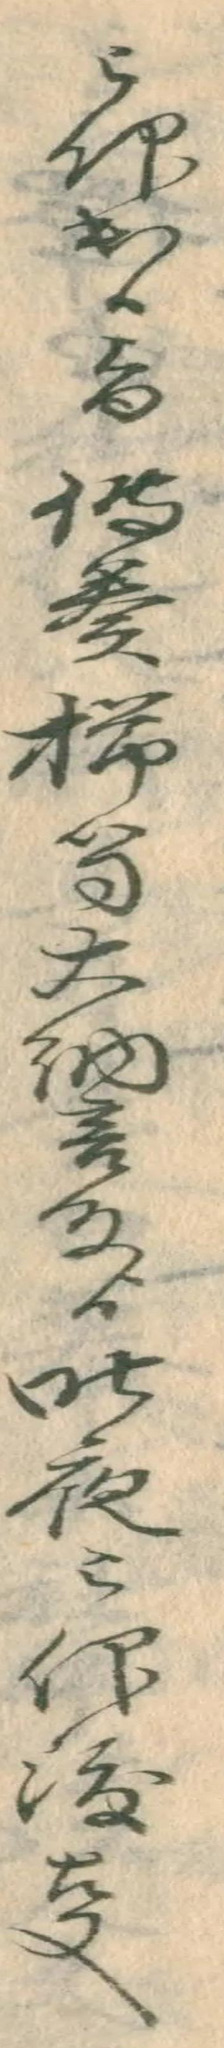被仰出候旨伝奏櫛笥大納言殿ゟ昨夜被仰渡事
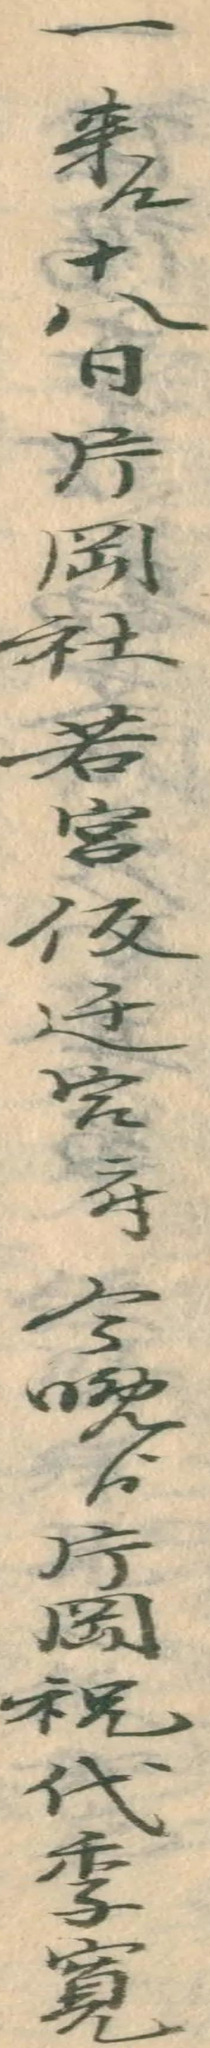一来ル十八日片岡社若宮仮迁宮ニ付今晩ゟ片岡祝代季寛
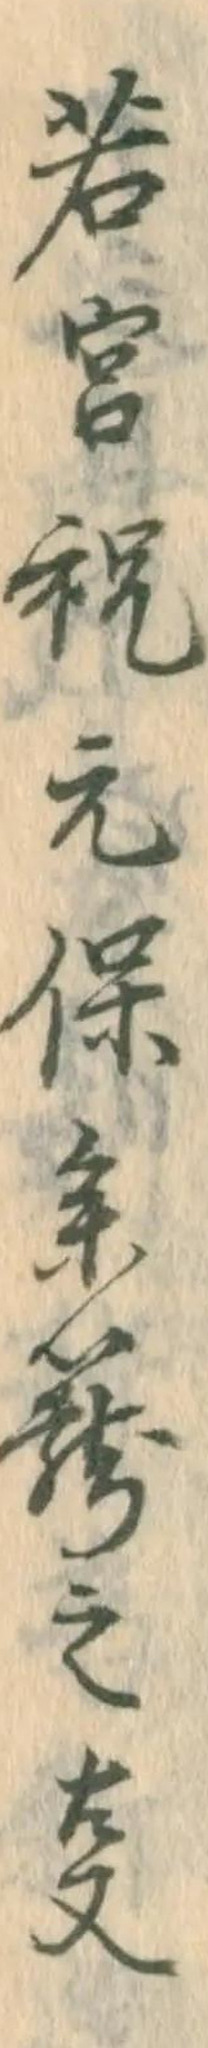若宮祝元保参籠之事

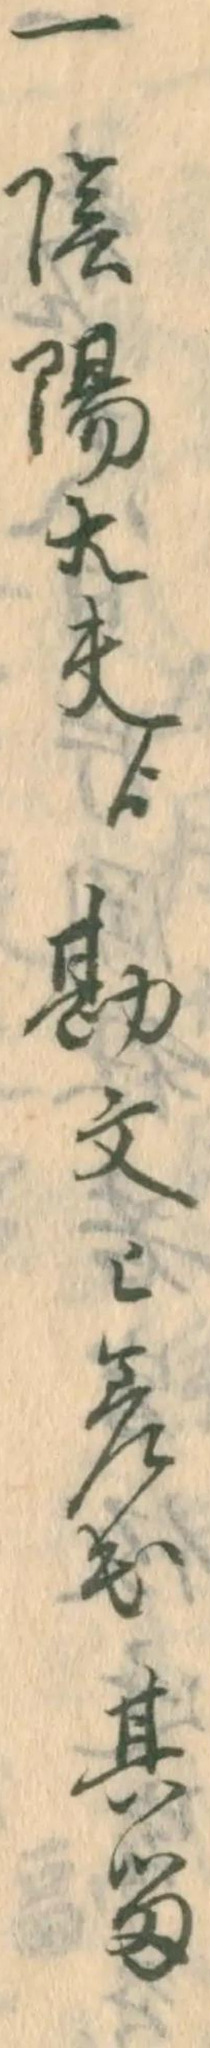一陰陽大夫ゟ勘文被差出其留
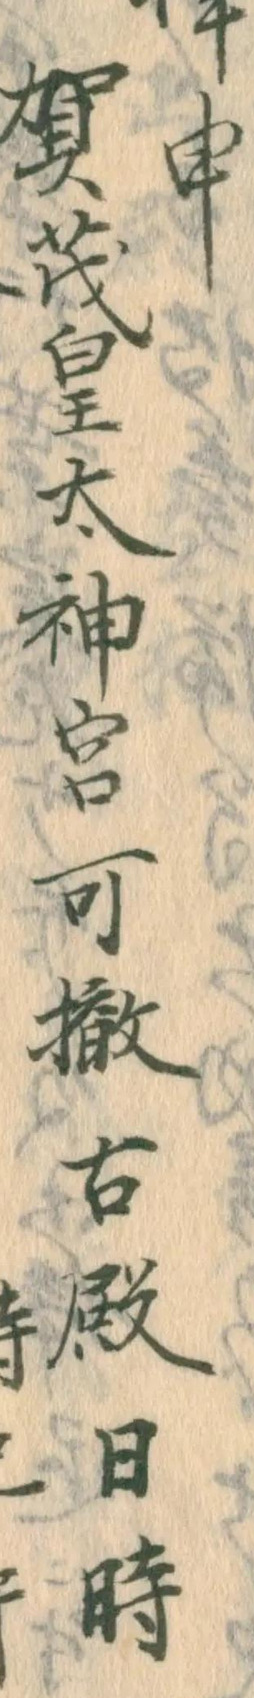賀茂皇太神宮可撤古殿日時
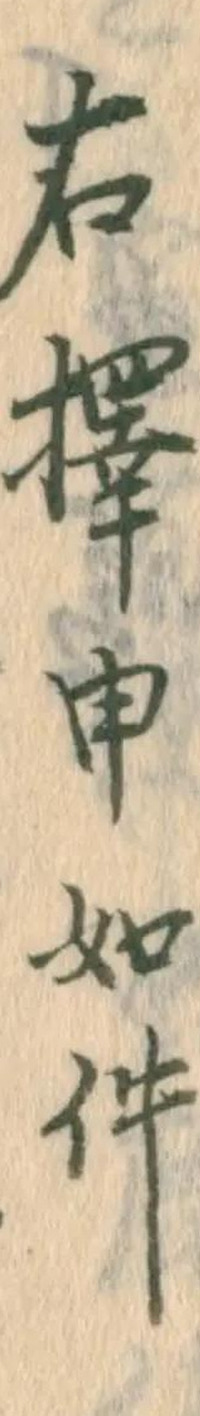右択申如件
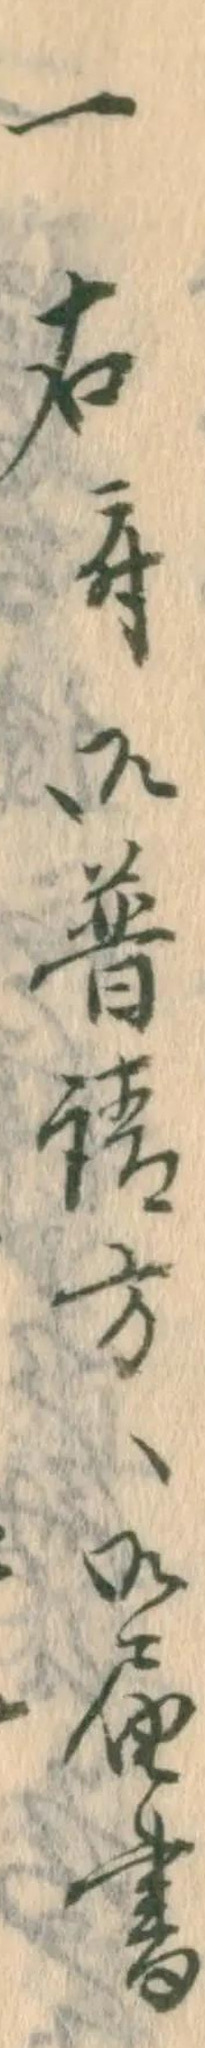一右ニ付御普請方へ御届書
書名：賀茂社記録. 第17冊
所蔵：国立国会図書館 National Diet Library, JAPAN
